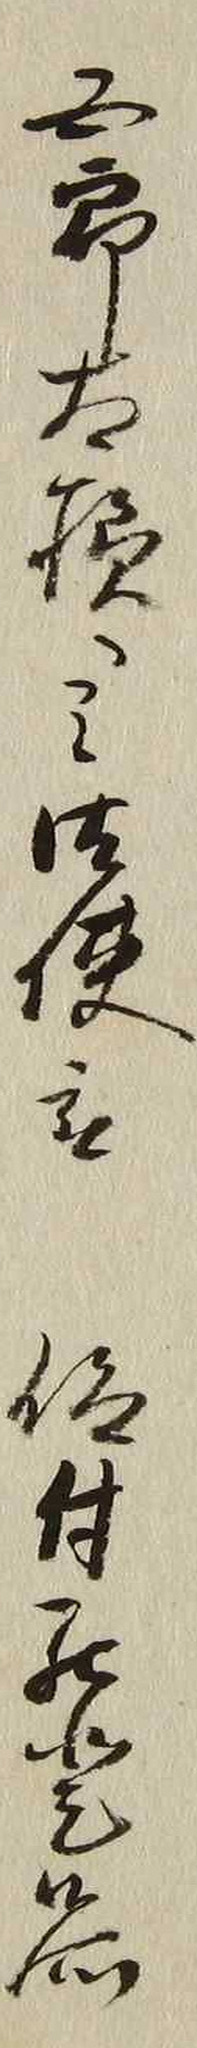五郎太様へ之御使被仰付罷登候所
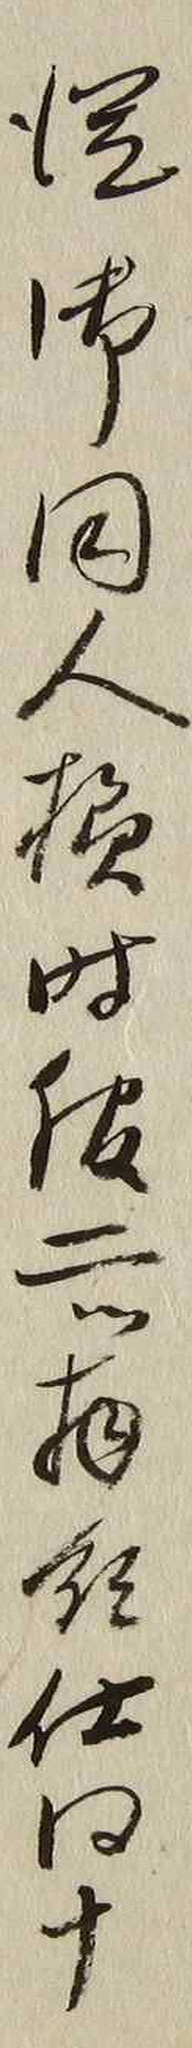従御同人様時服二ツ拝領仕同十
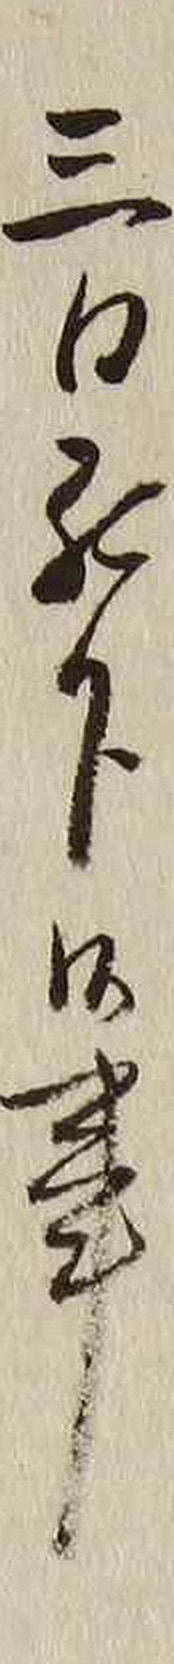三日罷下候事
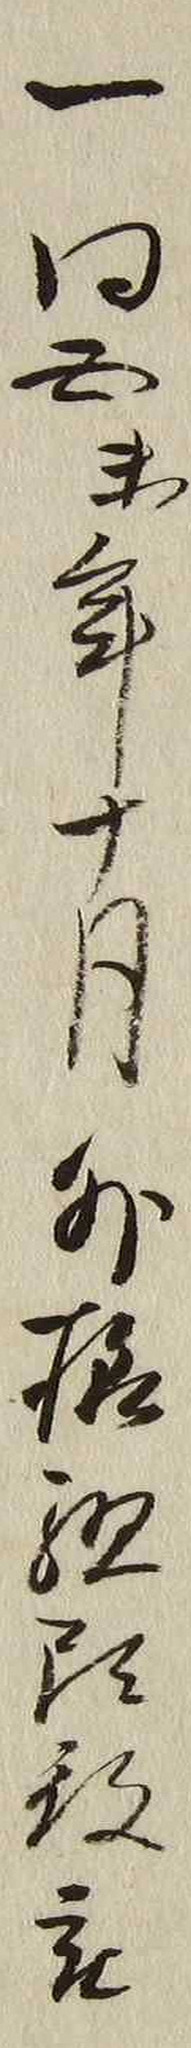一同五未年十月外様組頭役被
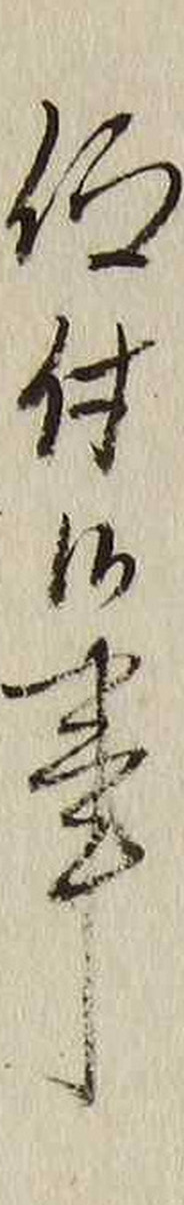仰付候事
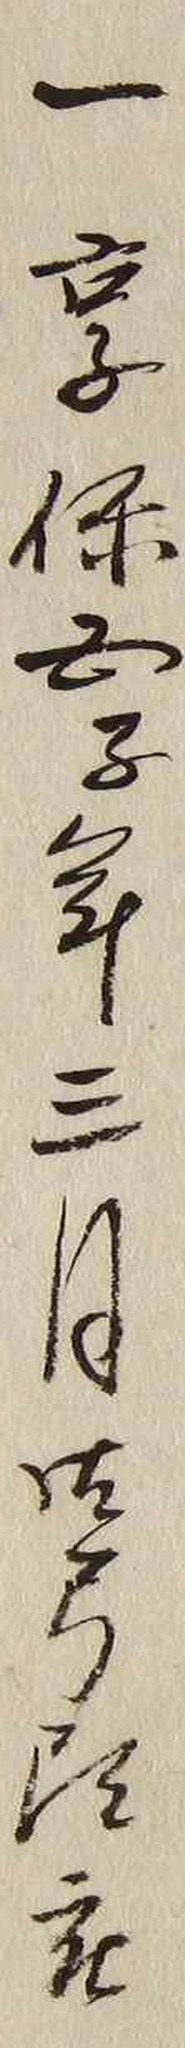一享保五子年三月御弓頭被
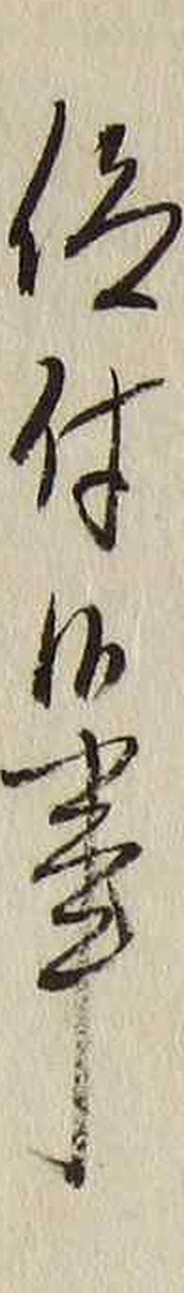仰付候事
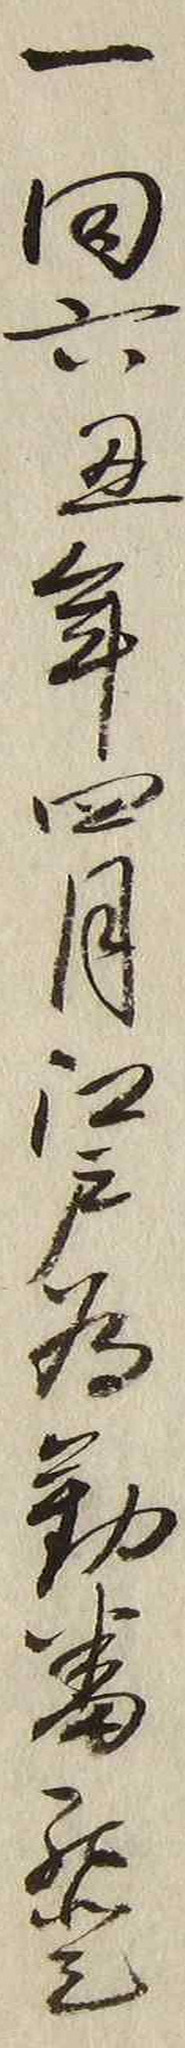一同六丑年四月江戸為勤番罷登
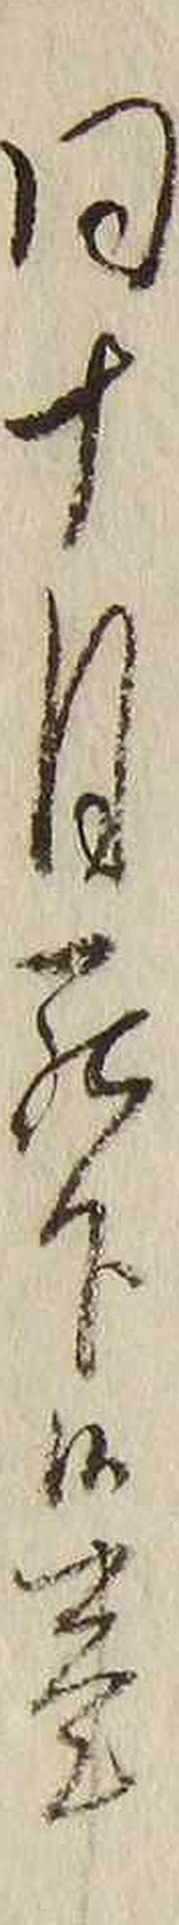同十月罷下候事

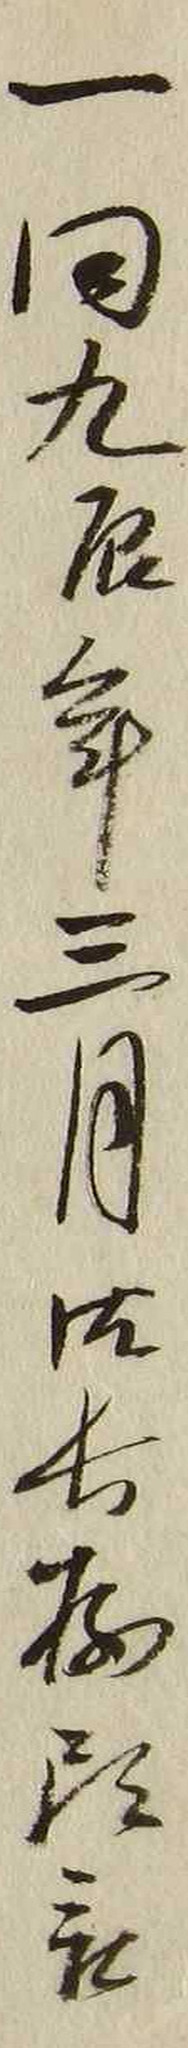一同九辰年三月御長柄頭被
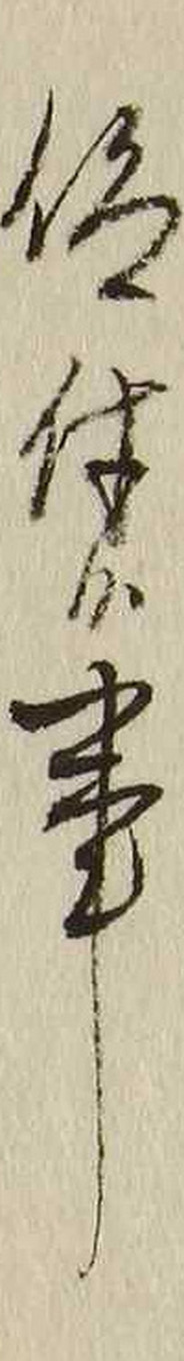仰付候事
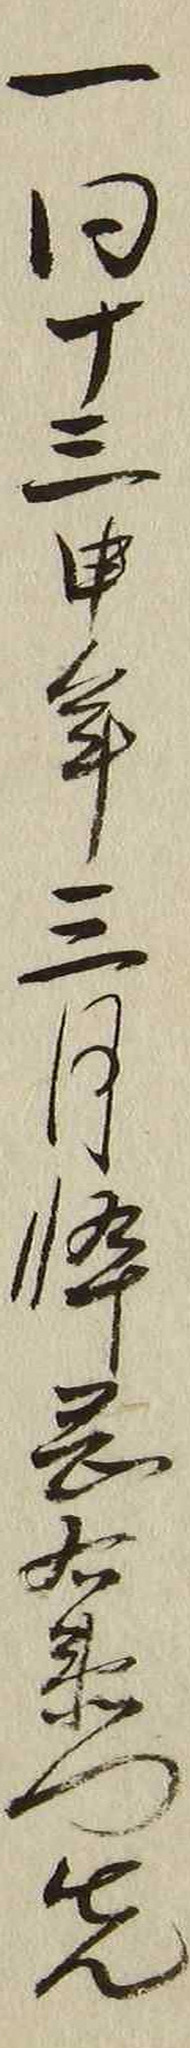一同十三申年三月忰岡右衛門先
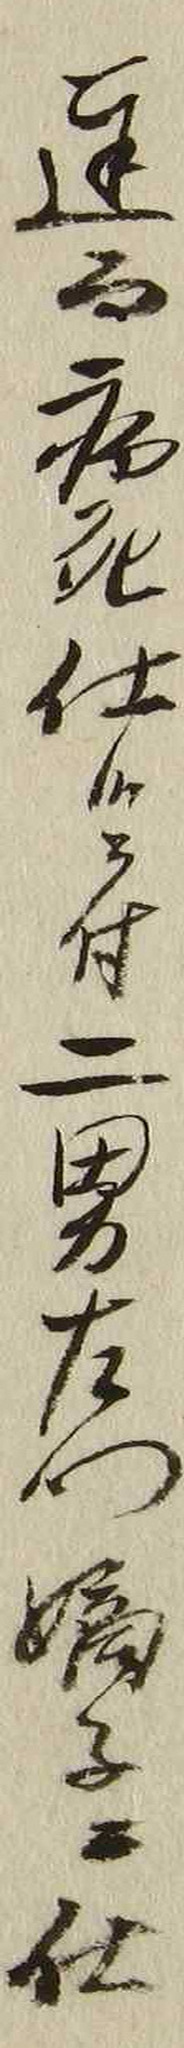達而病死仕候ニ付二男左門嫡子ニ仕
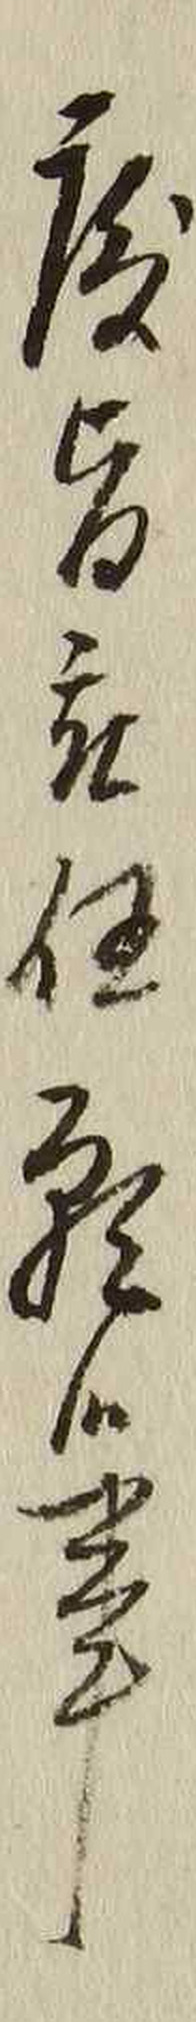度旨被任願候事
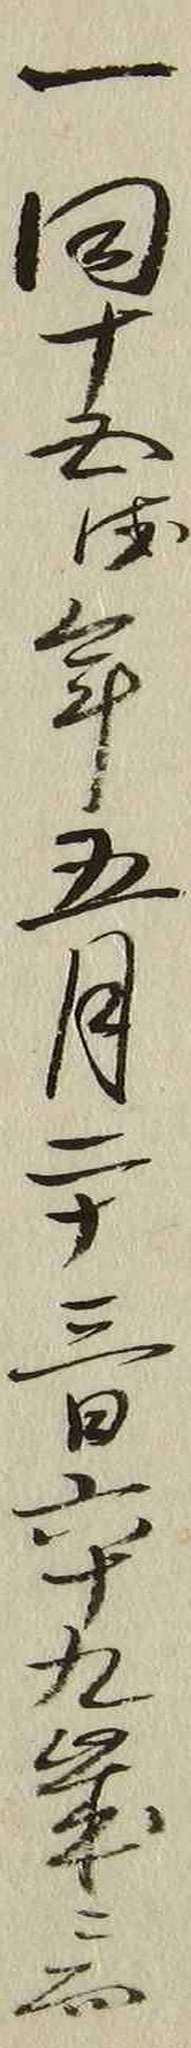一同十五戌年五月二十三日六十九歳ニ而
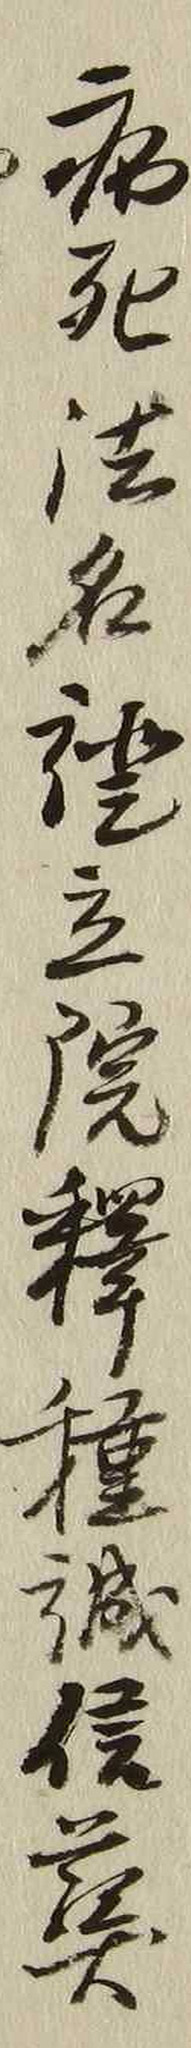病死法名証立院釈種誠信葬
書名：諸士系譜　巻之356　す之部6
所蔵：会津若松市立会津図書館
